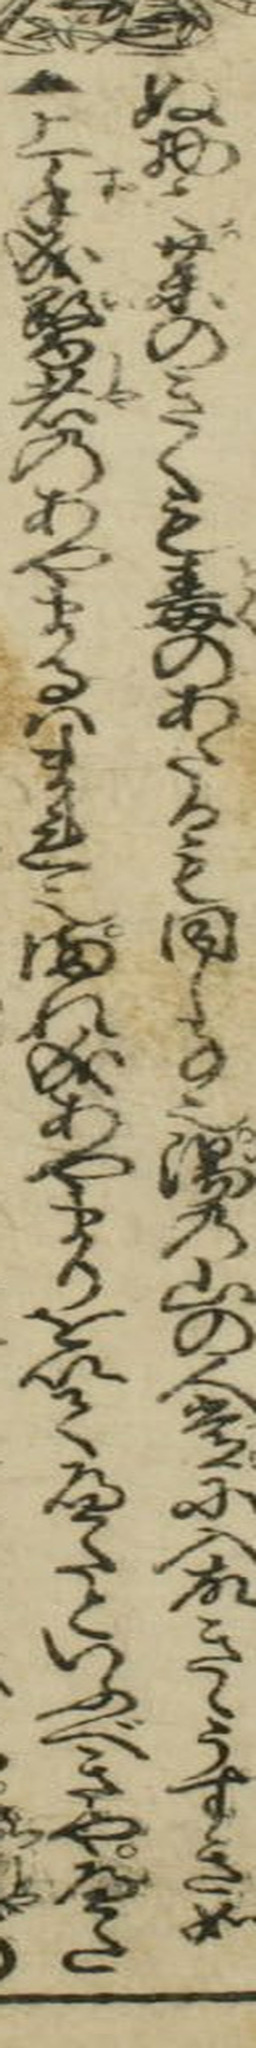▲上手成醫者のあやまるはまれ也。まれ成あやまりを以てへたといふべきや。へた
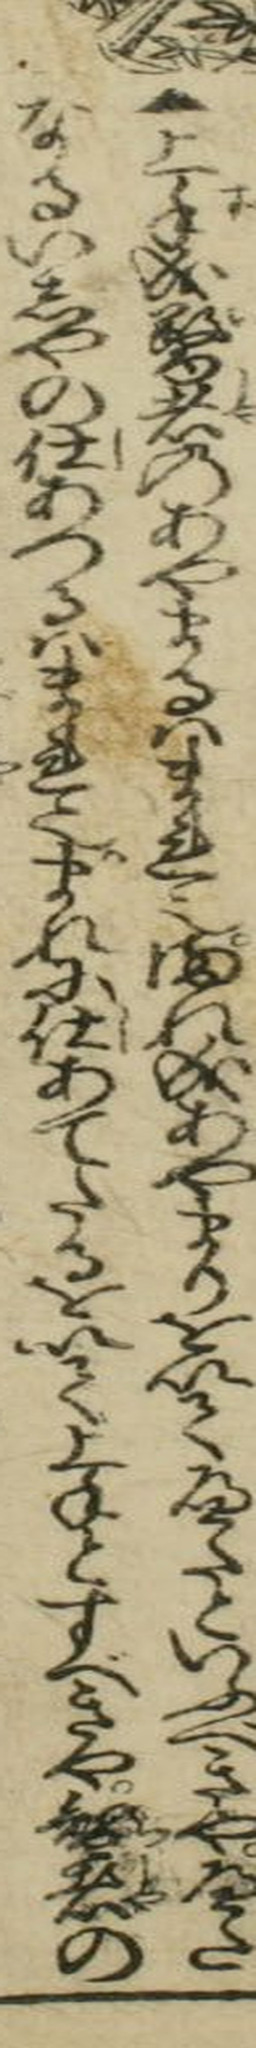なるいしやの仕あつるはまれ也。まれに仕あてたるを以て上手とすべきや。醫者の
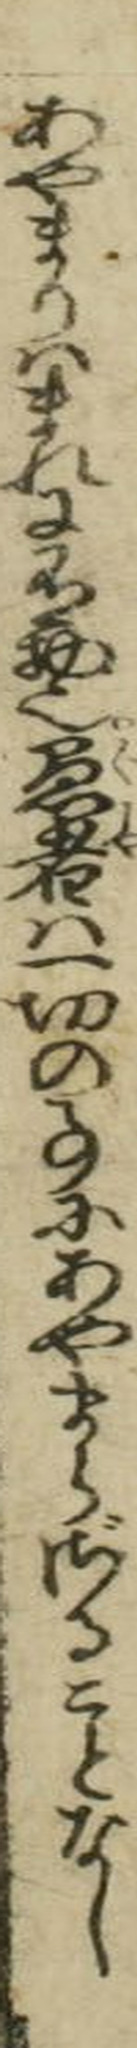あやまりはまれに有物也。愚者は一切の事にあやまらざることなし
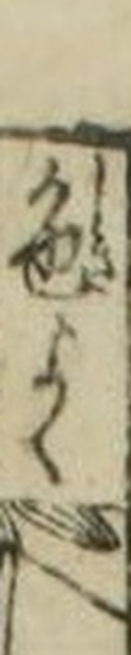色よく
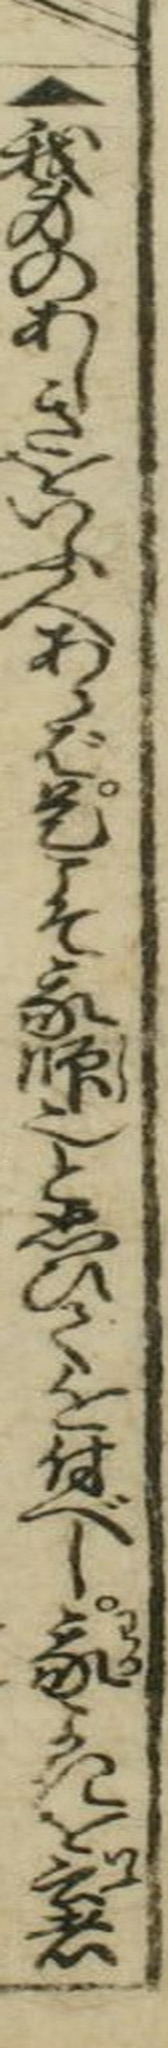▲我身のあしきをいふ人あらば。是こそ我師也と思ひて近付くべし。我よきを云者
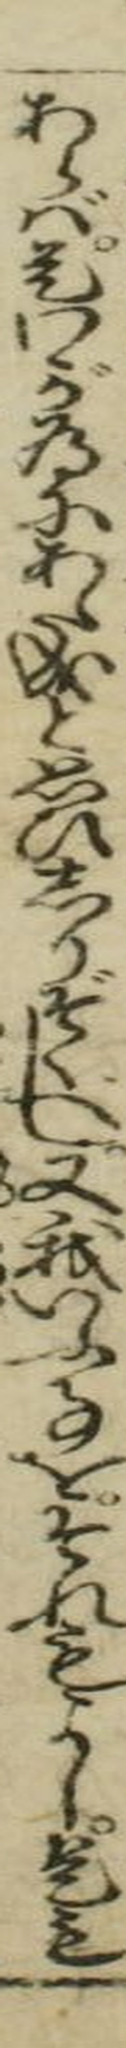あらば。是わが為にあた成と思ひしりぞくべし。又我いふ事を。それもよし。是も
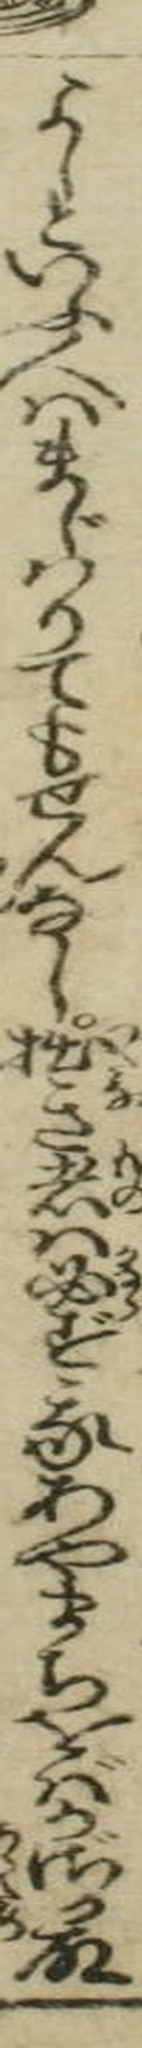よしといふひとはまじはりてもせんなし。拙き者は必ず我あやまちをばかざる故
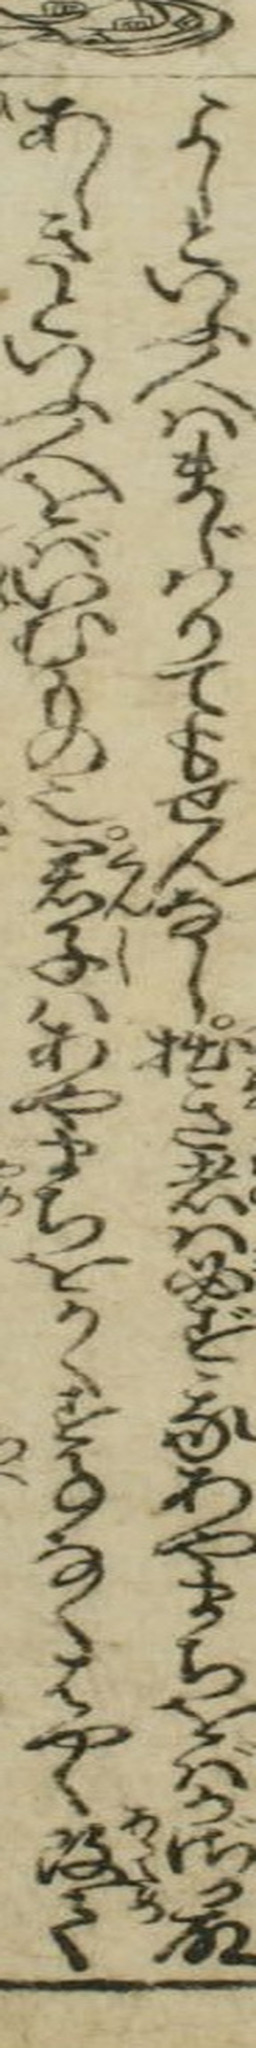あしきといふ人をばいむもの也。君子はあやまちをかくす事なくはやく改て
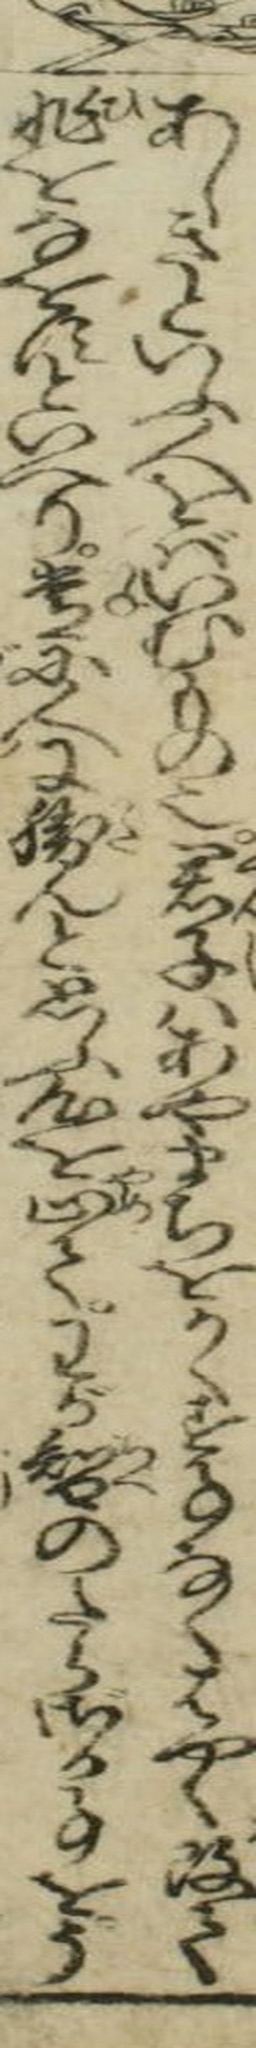非をなをすといへり。常に人に勝んと思ふ心を止て。わが智のたらざる事を。う
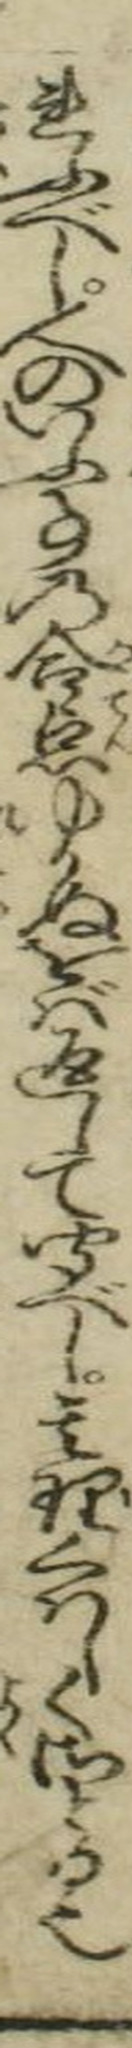れふべし。人のいふ事の合点ゆかぬをば返して聞べし。其理くはしくさとる也
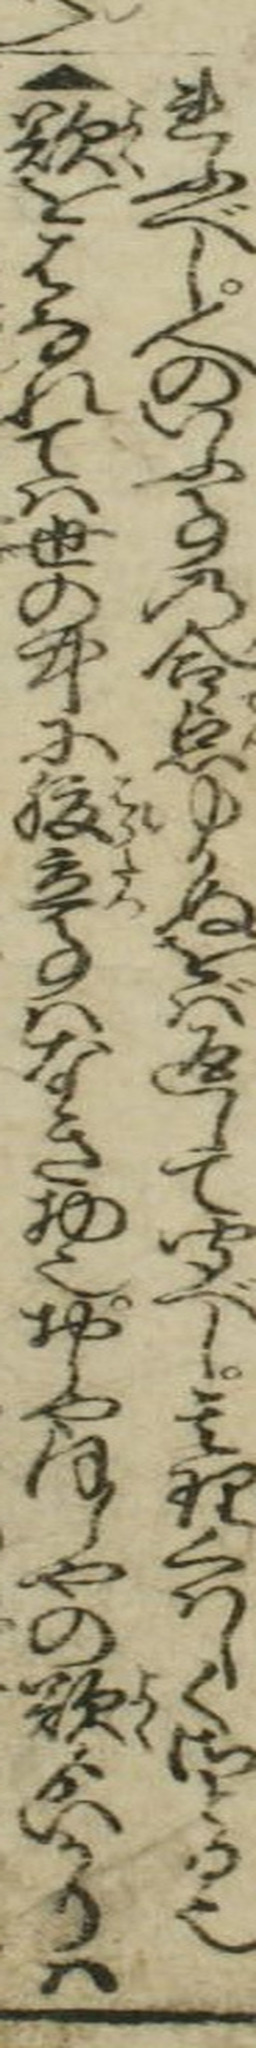▲欲をはなれては世のなかに腹立事はなき物也。おしやほしやの欲よりいかりは
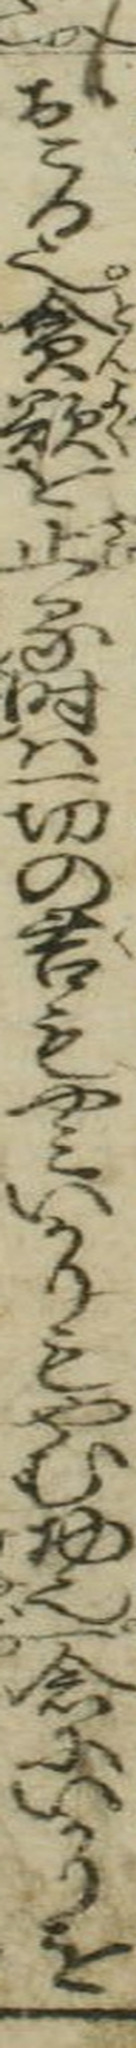おこる也。貪欲を止る時は一切の苦もやみいかりもやむ物也。一念にいかりを
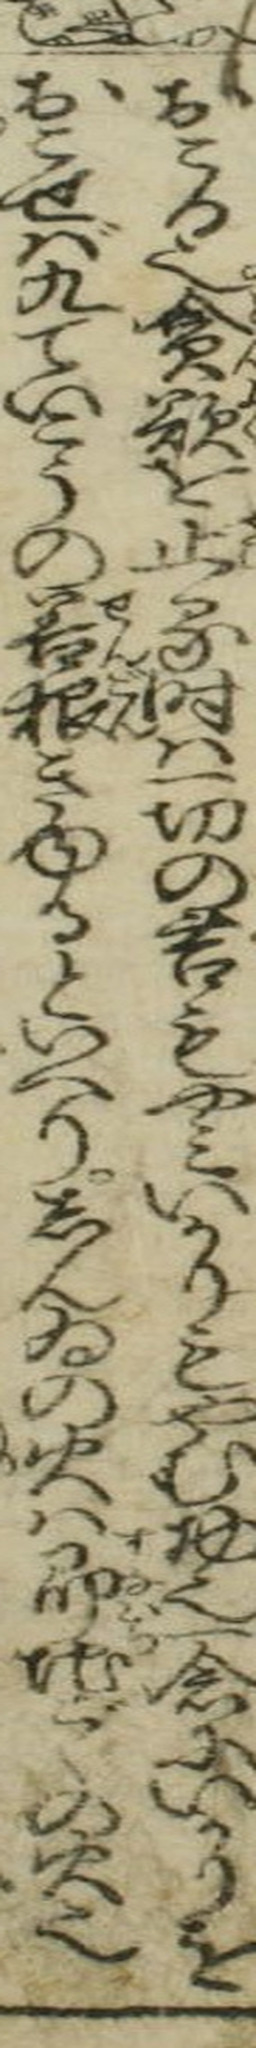おこせば九ていこうの善根きゆるといへり。しんゐの火は即地ごくの火也
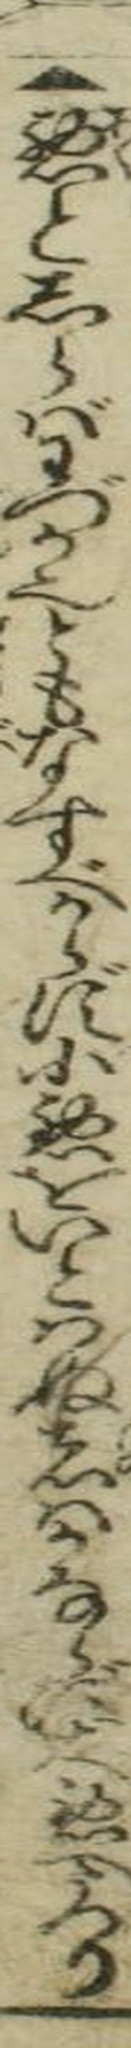▲悪としらばわづか也ともなすべからず。小悪をいとはぬ者は必ず大悪へたつり
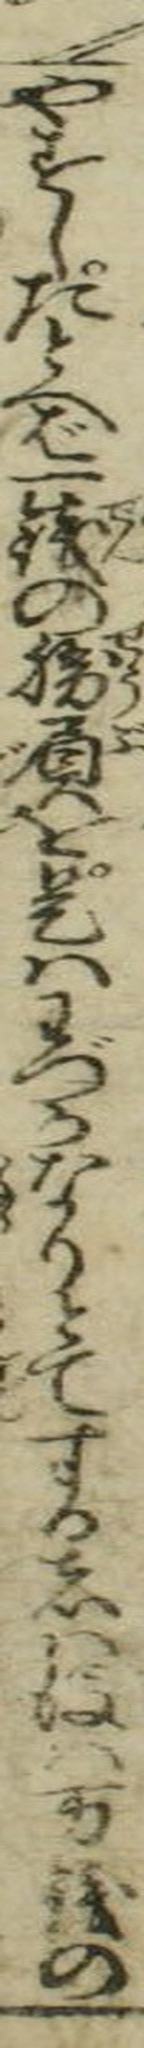やすし。たとへば一銭の勝負を。是はわづかなりとてする者は後は万銭の
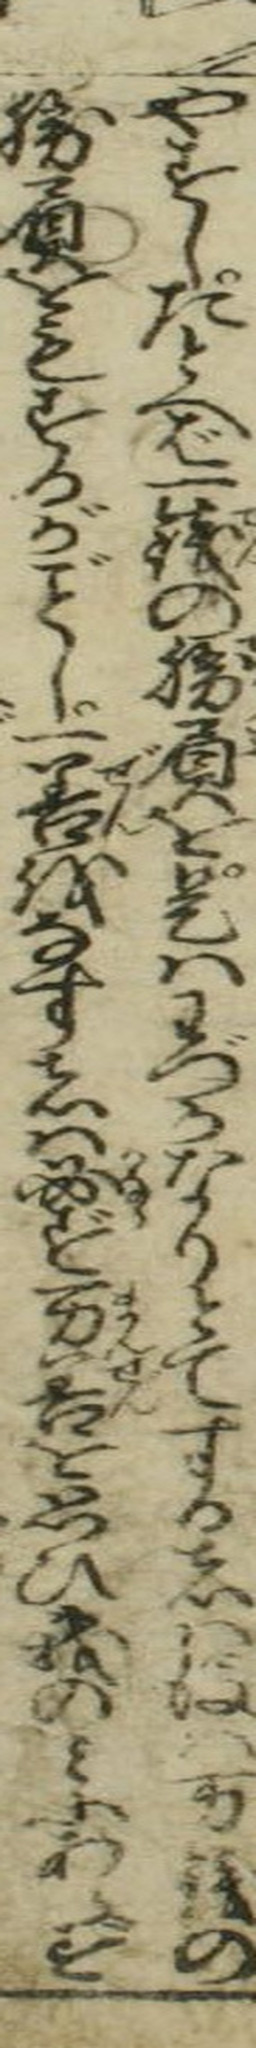勝負をもするがごとし。一善をなす者は必ず万善を思ひ我のみにあらず
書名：女源氏教訓鑑
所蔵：東京学芸大学附属図書館
